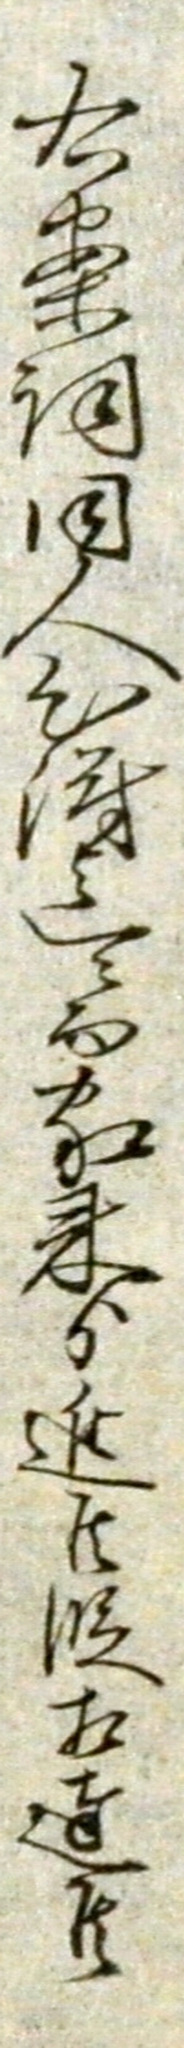右案詞同人心得迠ニ而家来ゟ進候段相達候

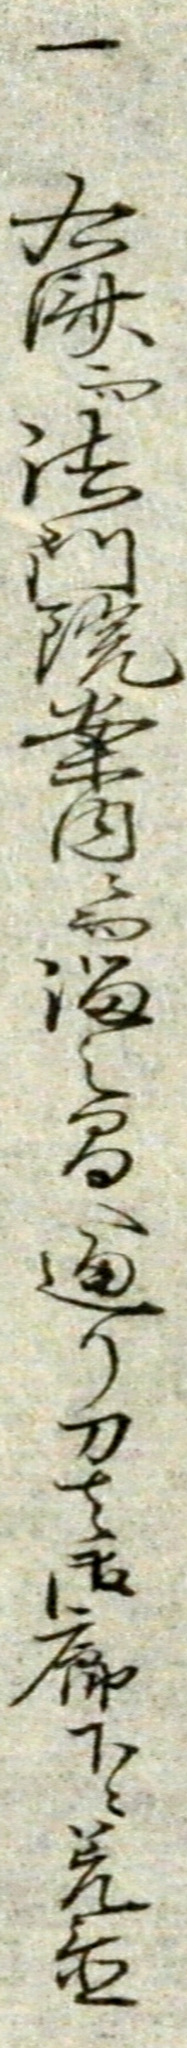一右済而法門院案内ニ而溜之間へ通り刀は御廊下ニ差置
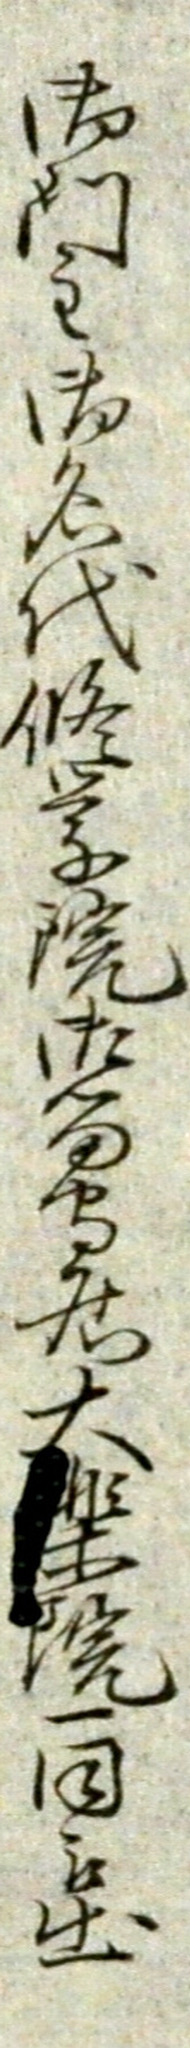御門主御名代修学院御留守居大楽院一同被出
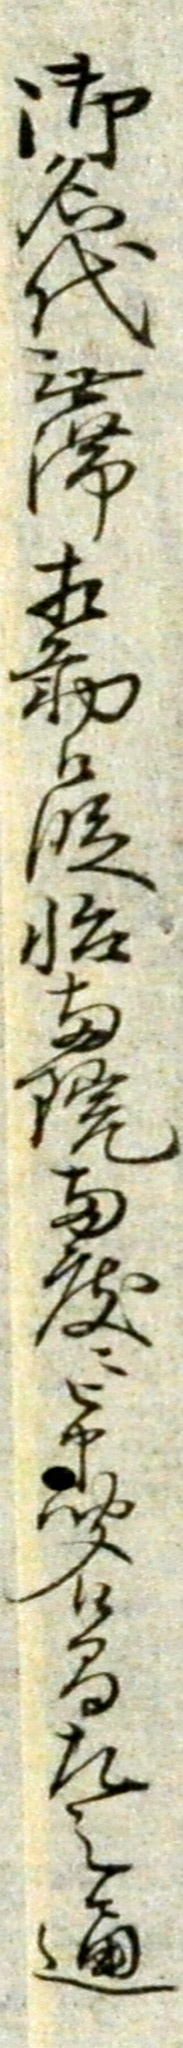御名代無滞相勤候段怡両院両度ニ被申聞候間左之通
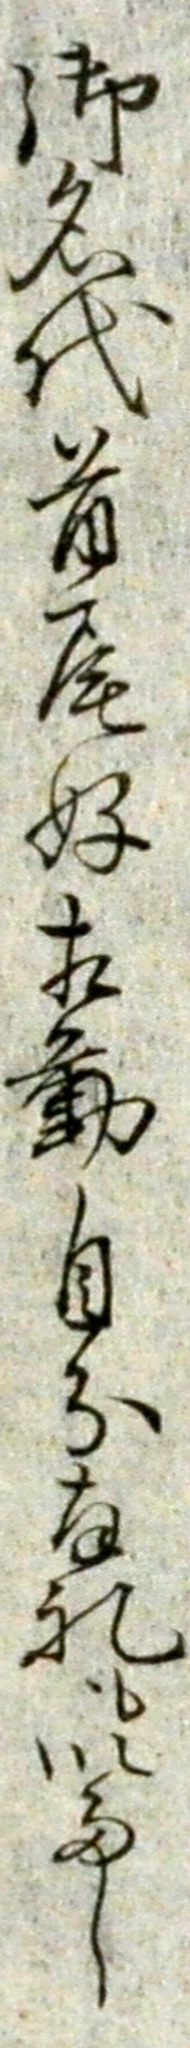御名代首尾好相勤自分拝礼もいたし
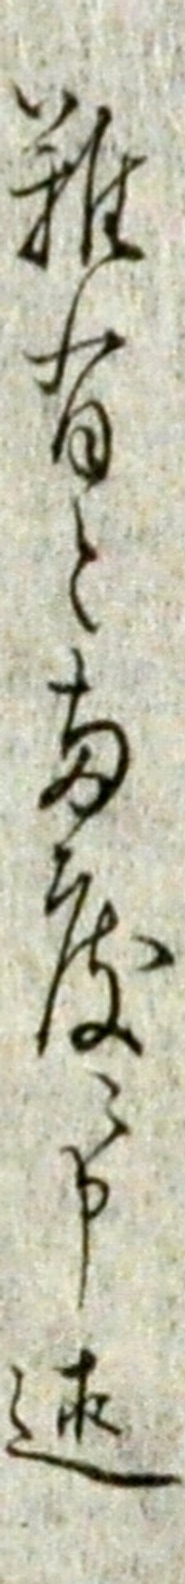難有と両度に申述
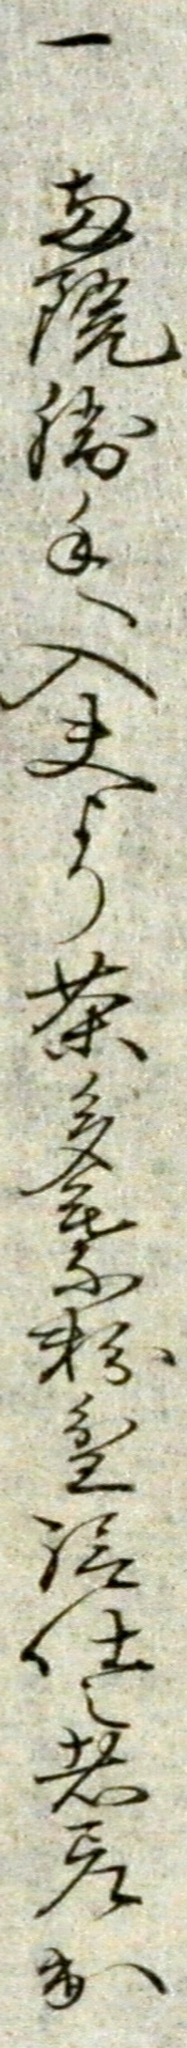一両院勝手へ入夫より茶多葉粉盆給仕之者差出
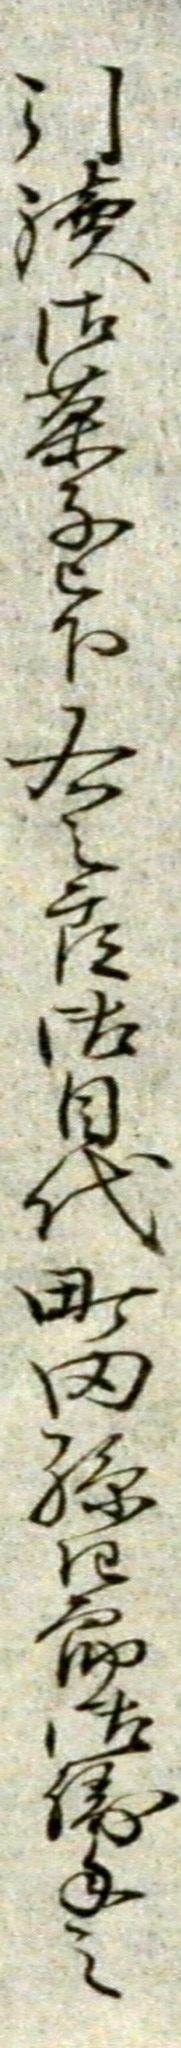引続御菓子被下右之節御目代町田孫四郎御勝手之
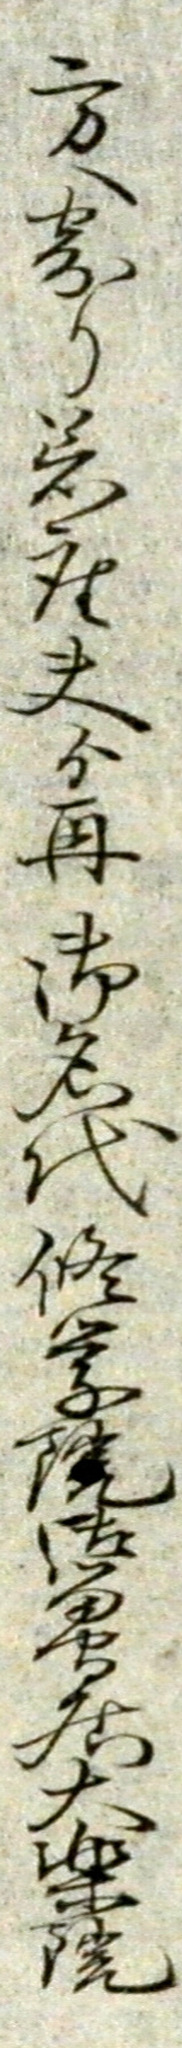方へ寄り着座夫ゟ再御名代修学院御留守居大楽院
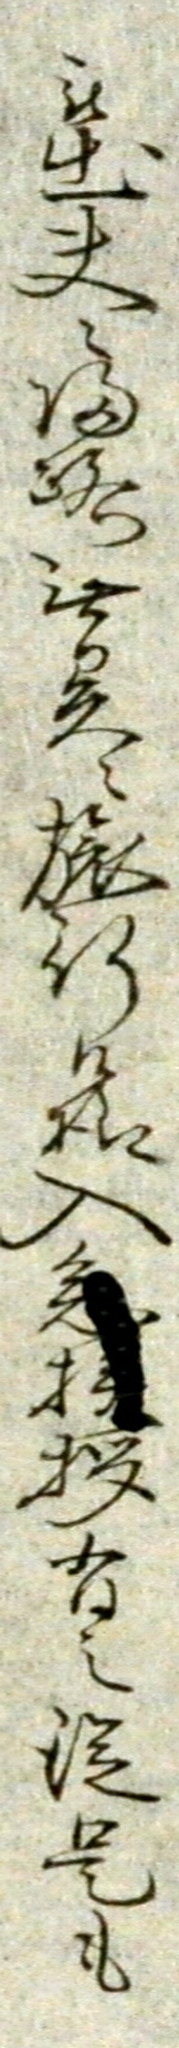被出夫々帰路無異ニ旅行候様入念挨拶有之従是も
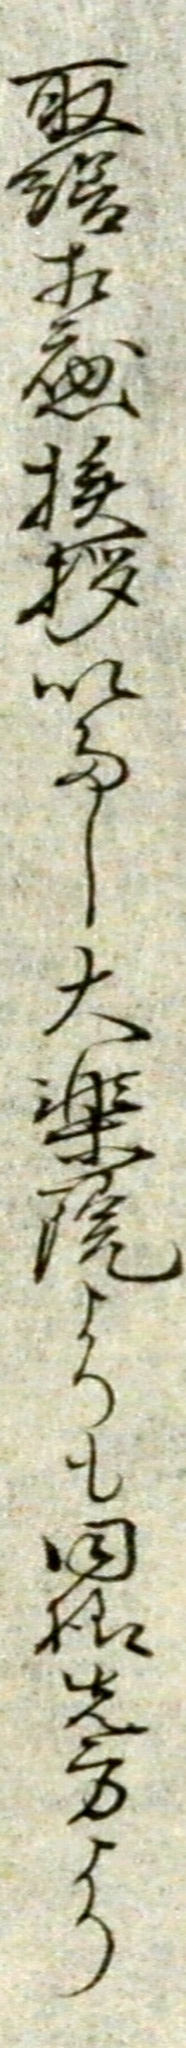取繕相応挨拶いたし大楽院よりも同様先方より
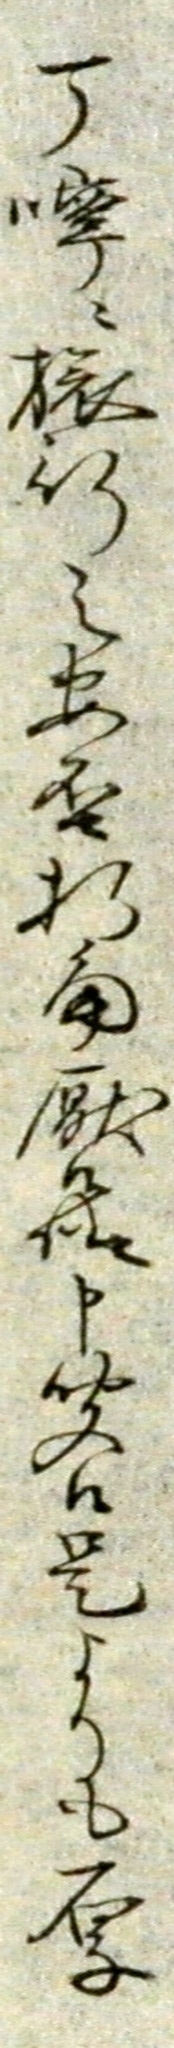丁寧ニ旅行之安否折角厭候様申聞候是よりも厚
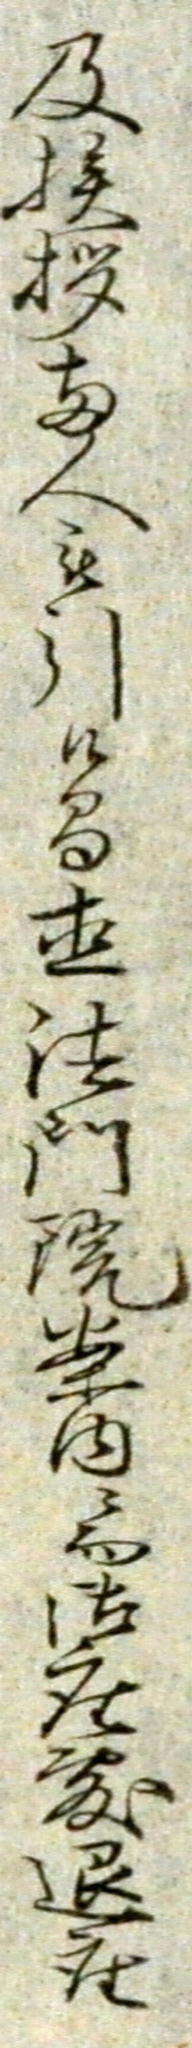及挨拶両人被引候間直法門院案内ニ而御座敷退座
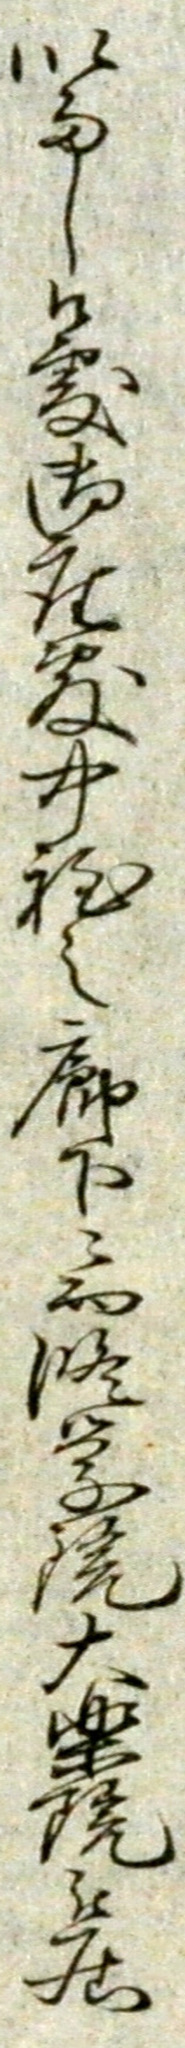いたし候処御座敷中程之廊下ニ而修学院大楽院被居
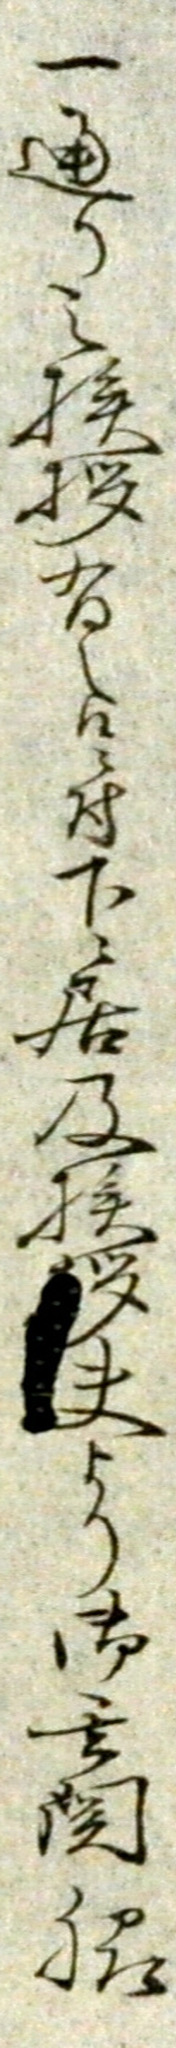一通り之挨拶有之候ニ付下ニ居及挨拶夫より御玄関脇
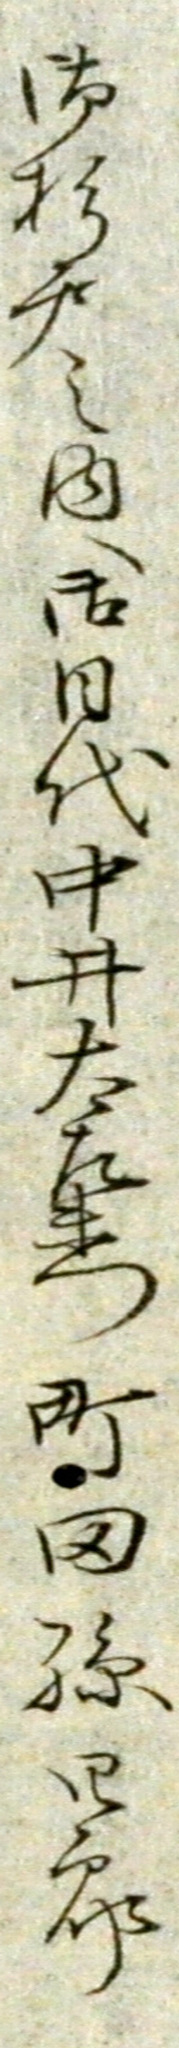御杉戸之内へ御目代中井太左衛門町田孫四郎
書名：日光御名代相勤候節ノ留
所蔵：伊那市立高遠町図書館・合同会社AMANE
